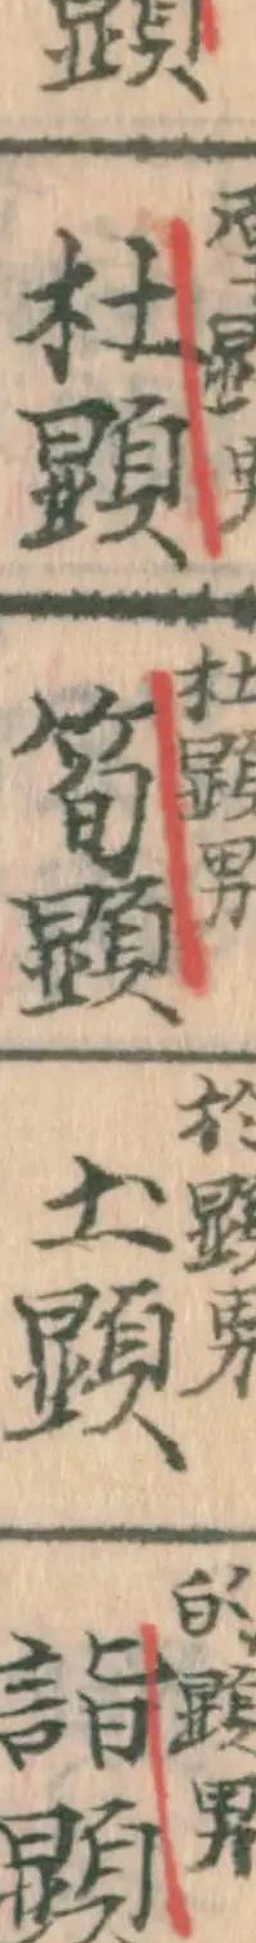亮顕杜顕筍顕土顕詣顕
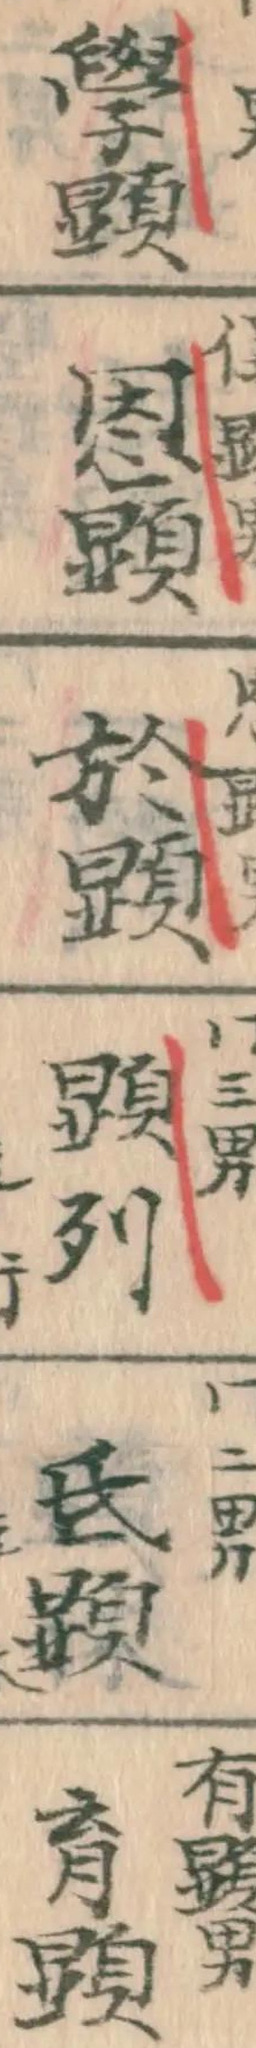学顕恩顕於顕顕列氏顕育顕
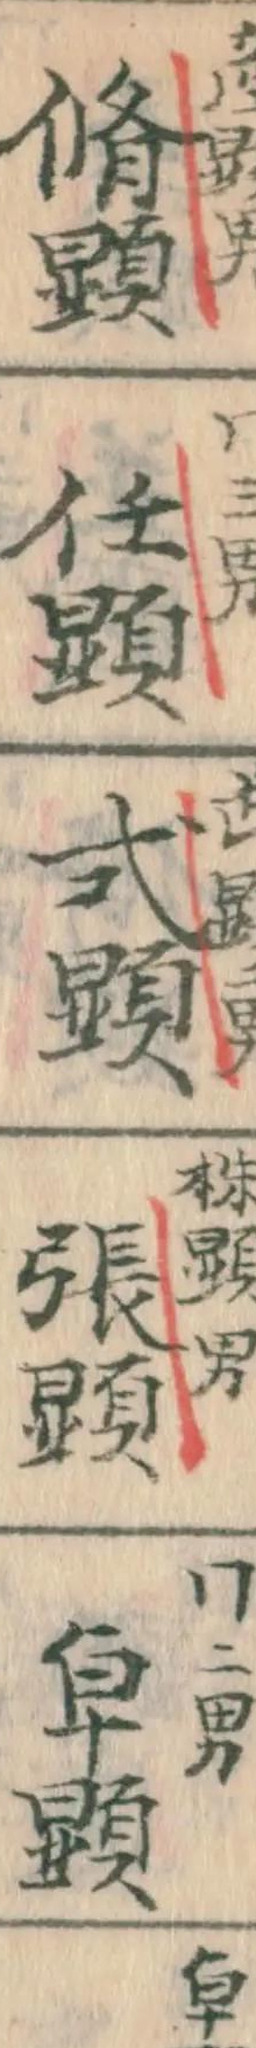脩顕任顕式顕張顕卓顕
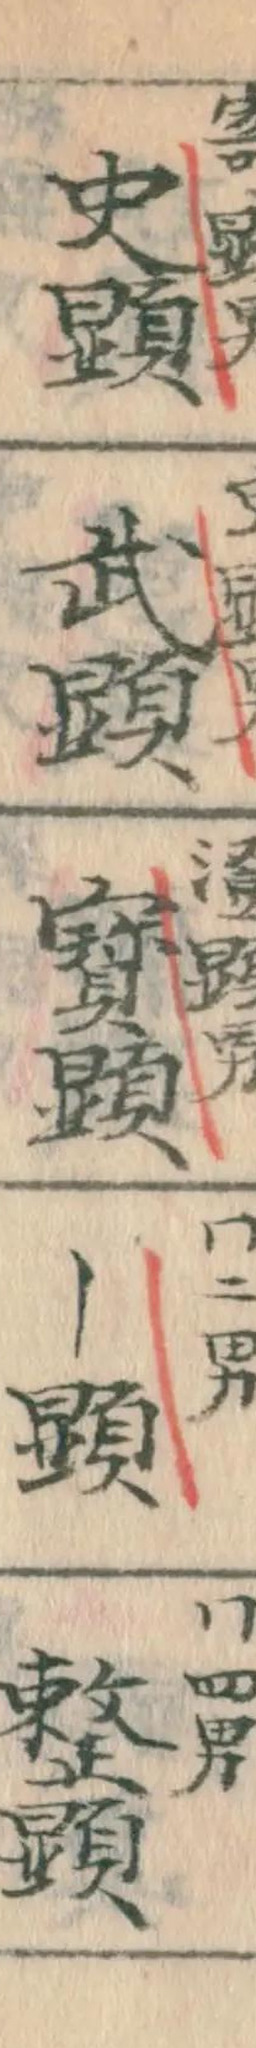史顕武顕宝顕ー顕整顕

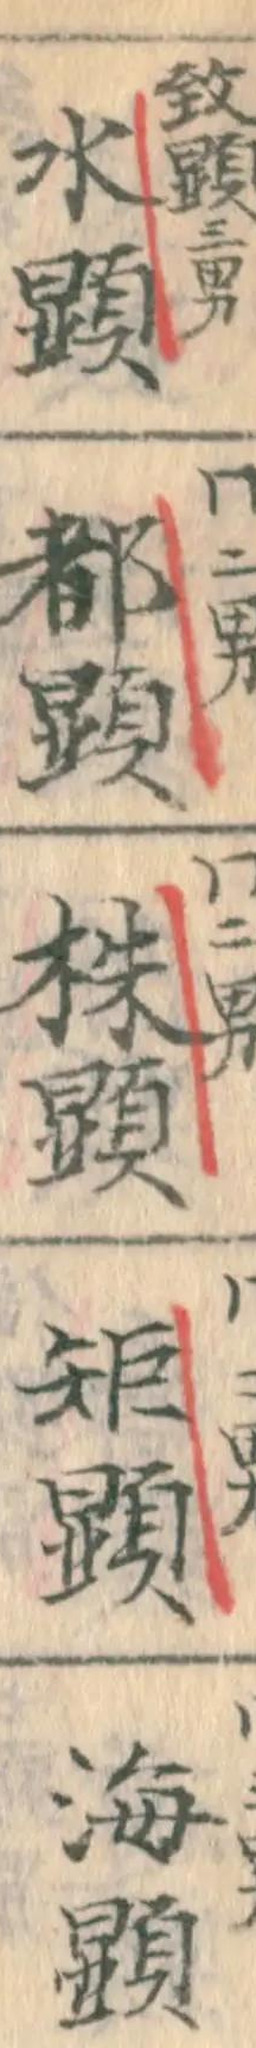水顕都顕株顕矩顕海顕
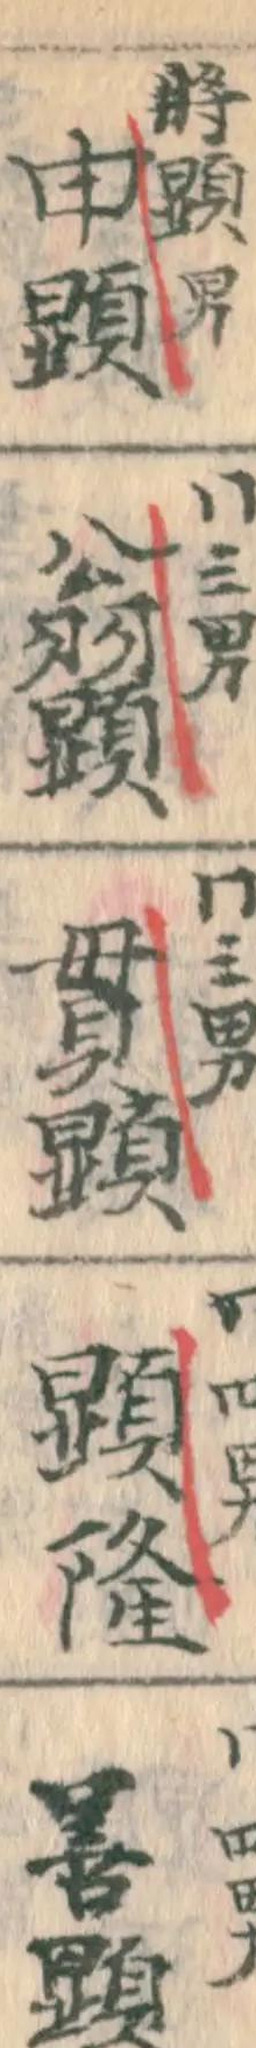申顕翁顕貫顕顕隆善顕
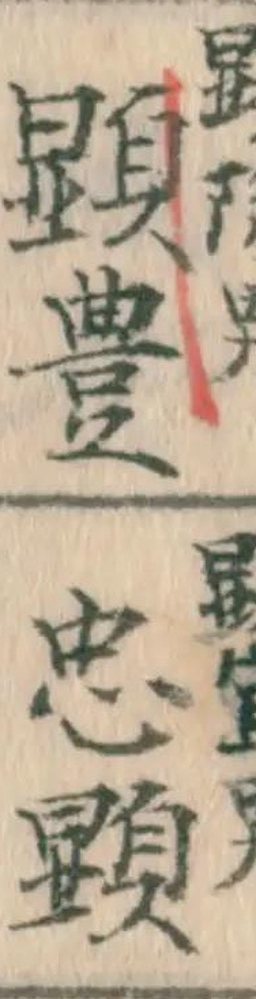顕豊忠顕

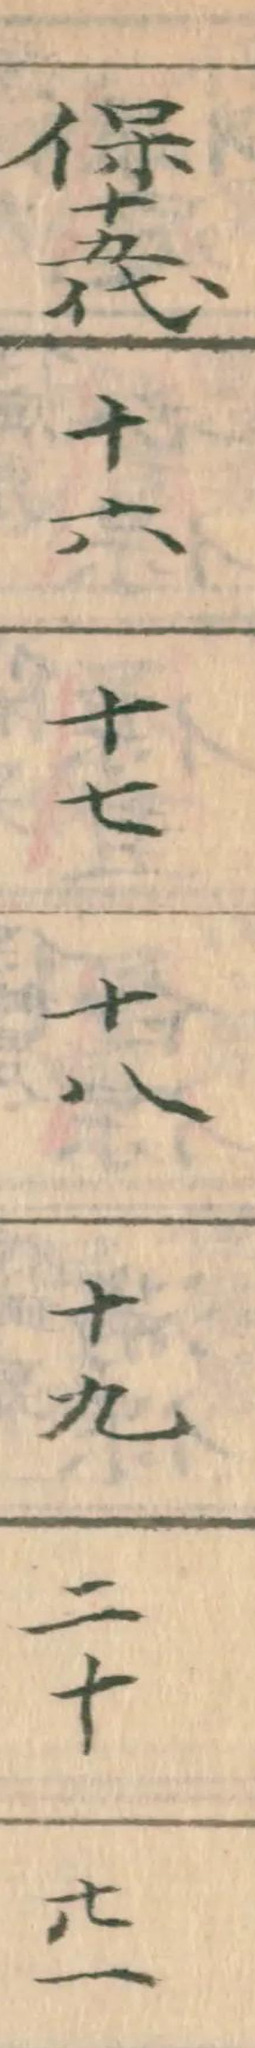保十五代十六十七十八十九二十廿一
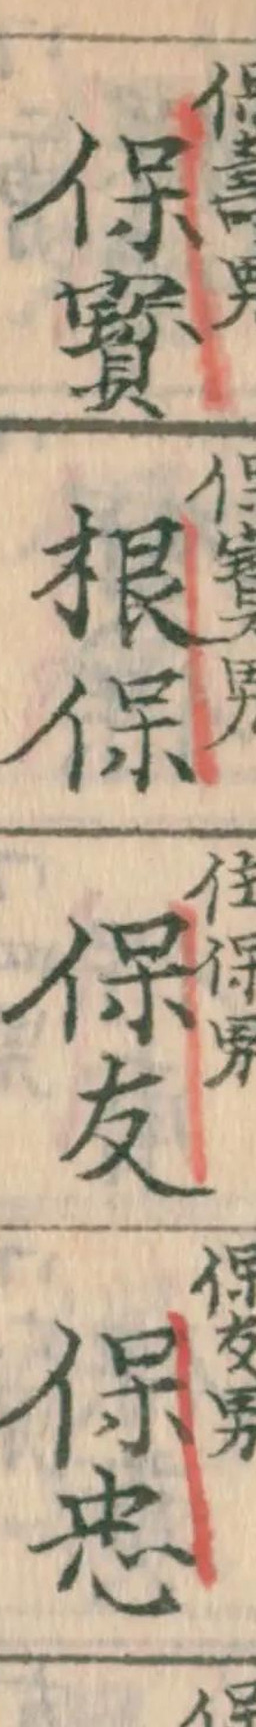保宝根保保友保忠
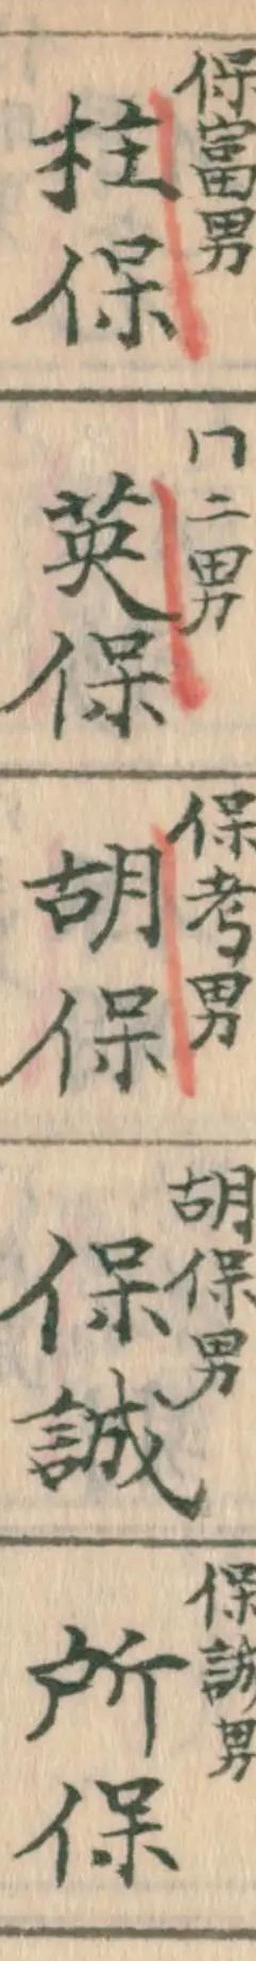柱保英保胡保保誠所保
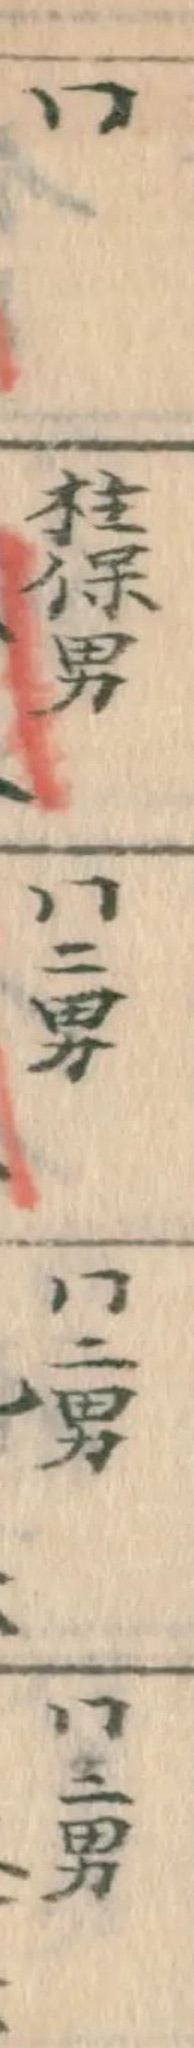同柱保男同二男同二男同三男
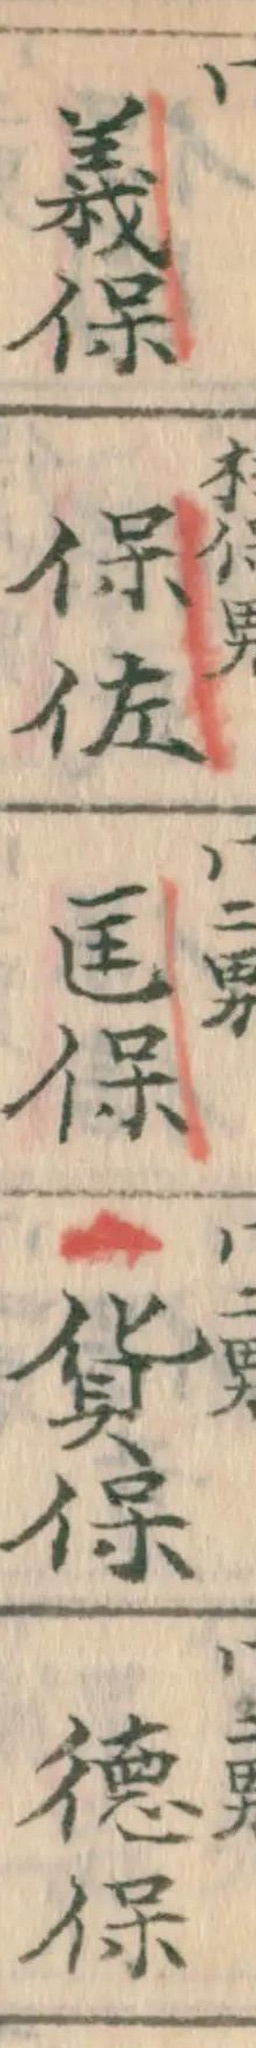義保保佐匡保▲貨保徳保
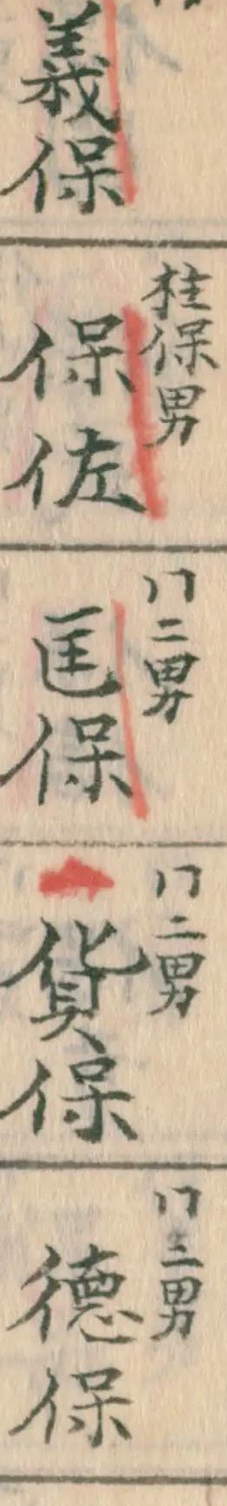義保保佐匡保▲貨保徳保
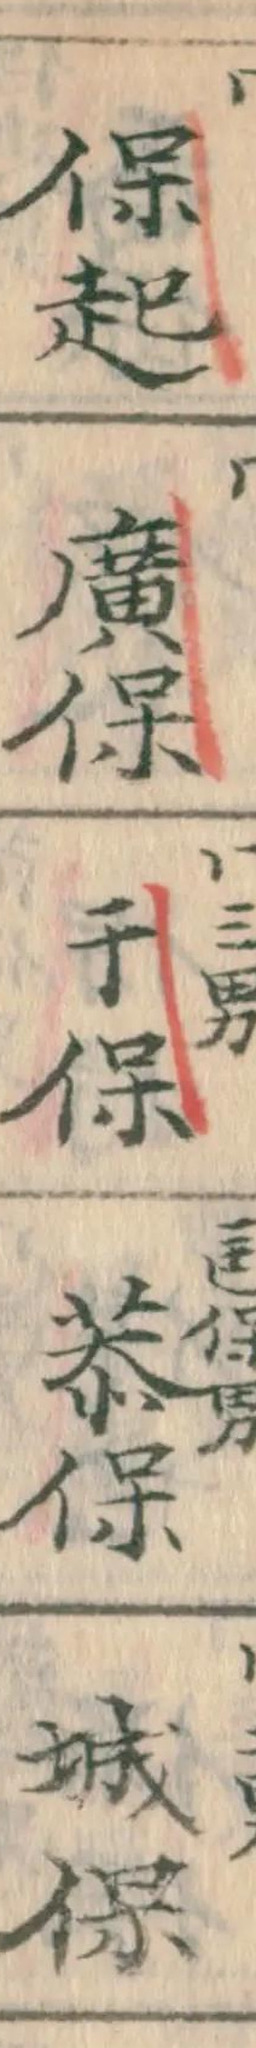保起広保于保恭保城保
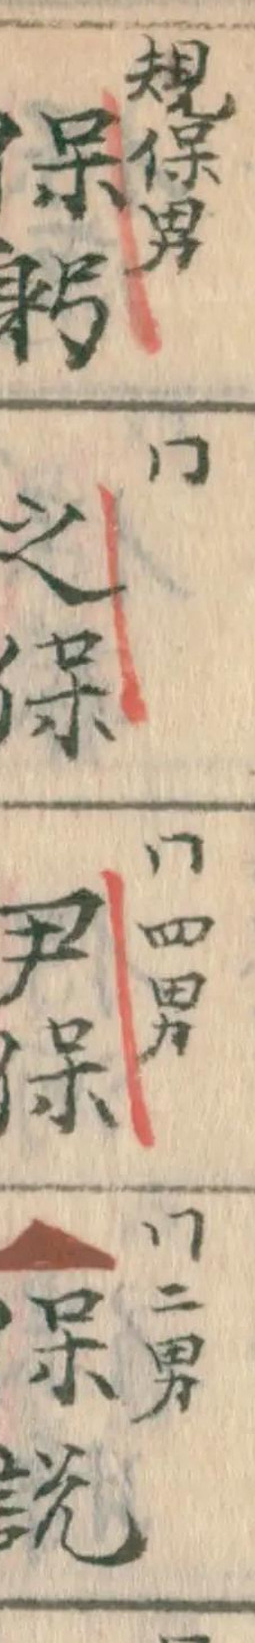保躬之保尹保▲保説
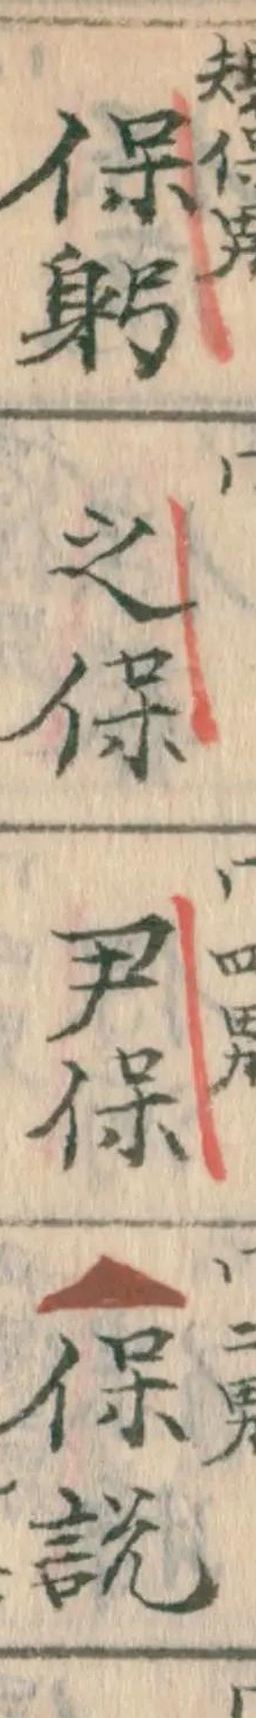保躬之保尹保▲保説
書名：賀茂社記録. 第24冊
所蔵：国立国会図書館 National Diet Library, JAPAN
